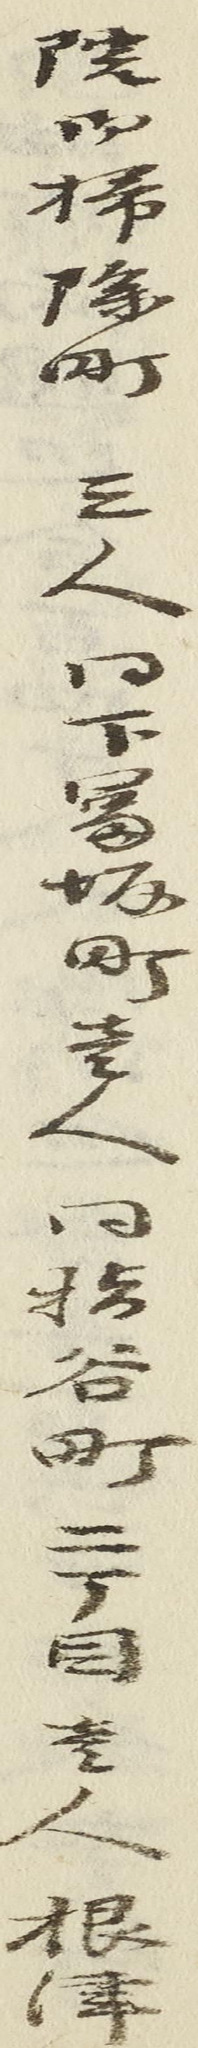院御掃除町三人同下富坂町壱人同指谷町二丁目壱人根津
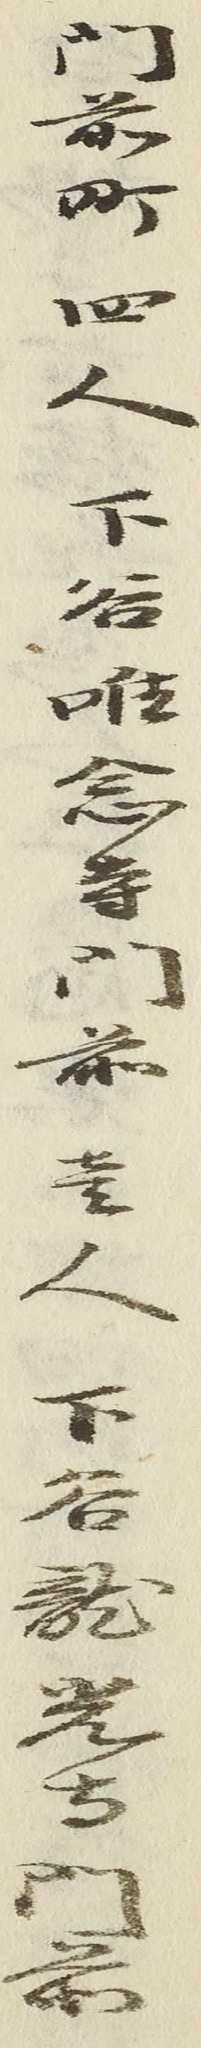門前町四人下谷唯念寺門前壱人下谷龍光寺門前
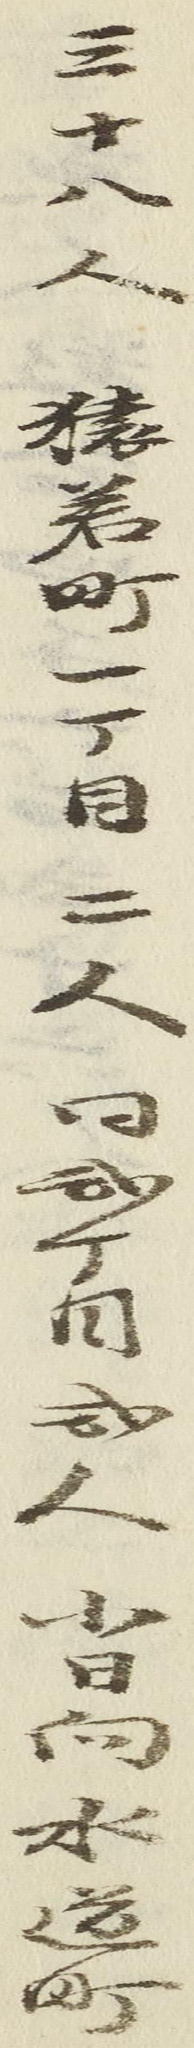三十八人猿若町一丁目二人同弐丁目弐人小日向水道町
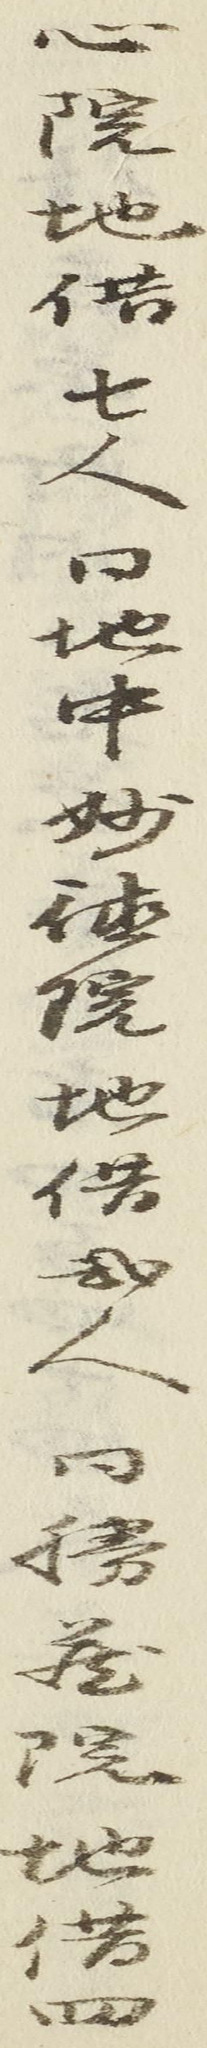心院地借七人同地中妙徳院地借弐人同勝蔵院地借四
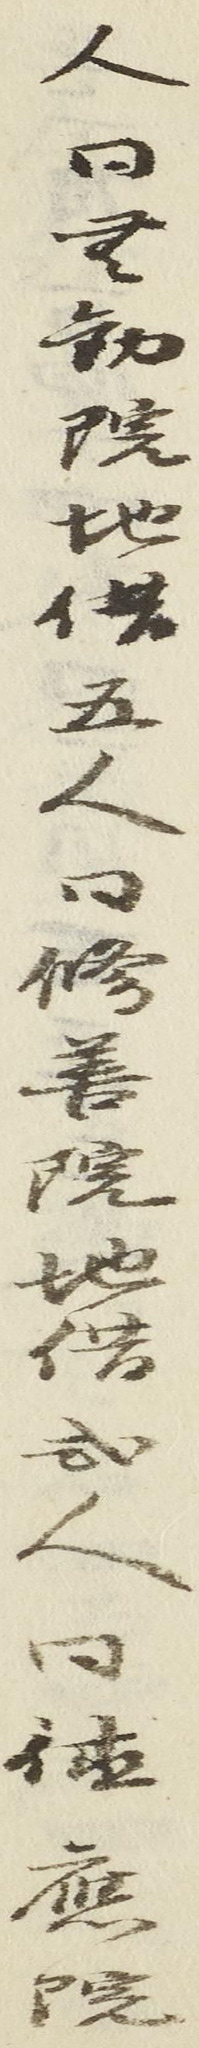人同無勧院地借五人同修善院地借弐人同徳応院
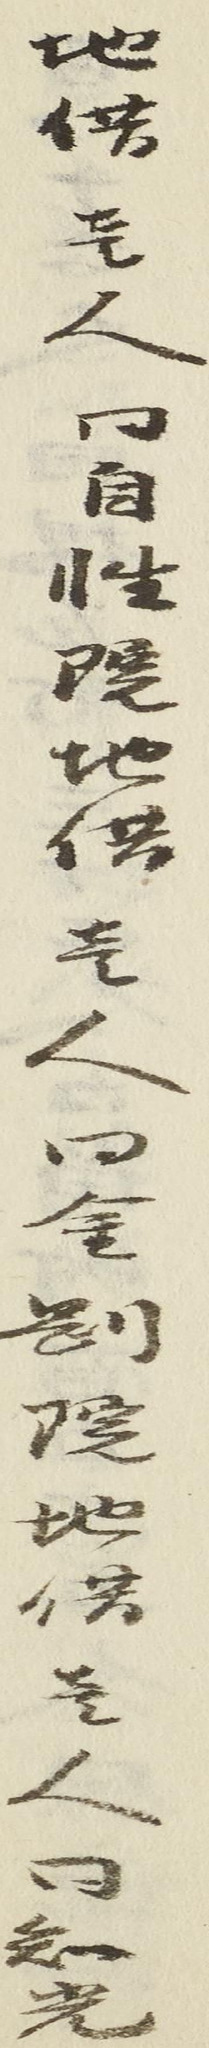地借壱人同自性院地借壱人同金剛院地借壱人同知光
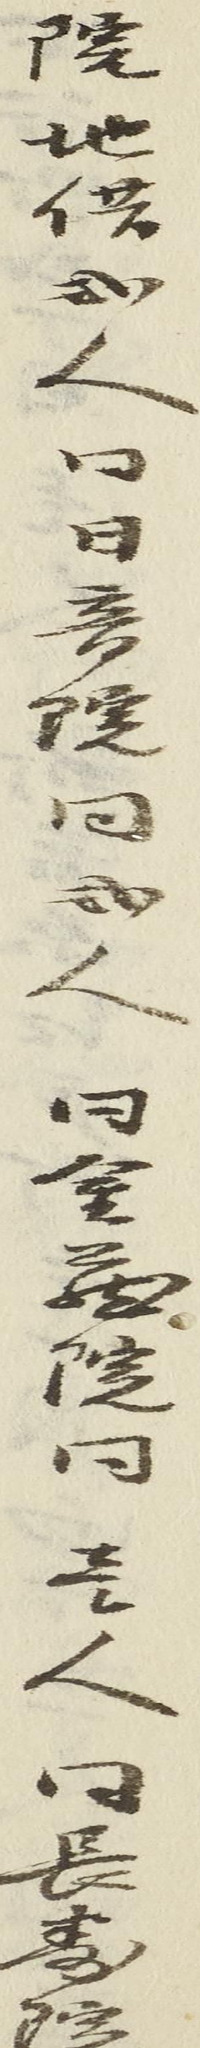院地借弐人同日音院同弐人同金蔵院同壱人同長寿院
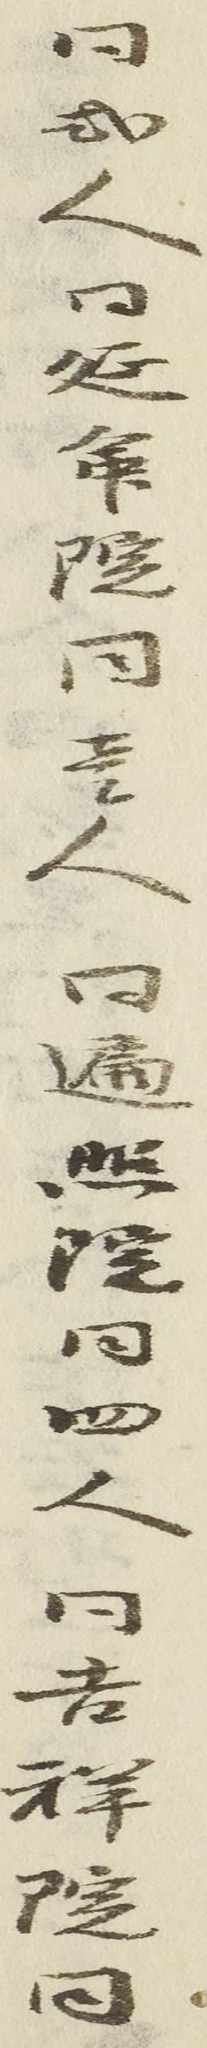同弐人同延命院同壱人同遍照院同四人同吉祥院同
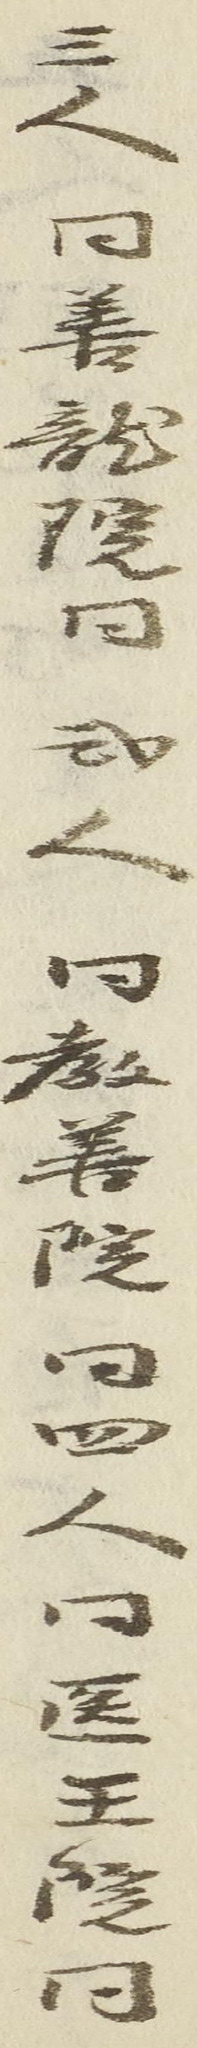三人同善龍院同弐人同教善院同四人同医王院同

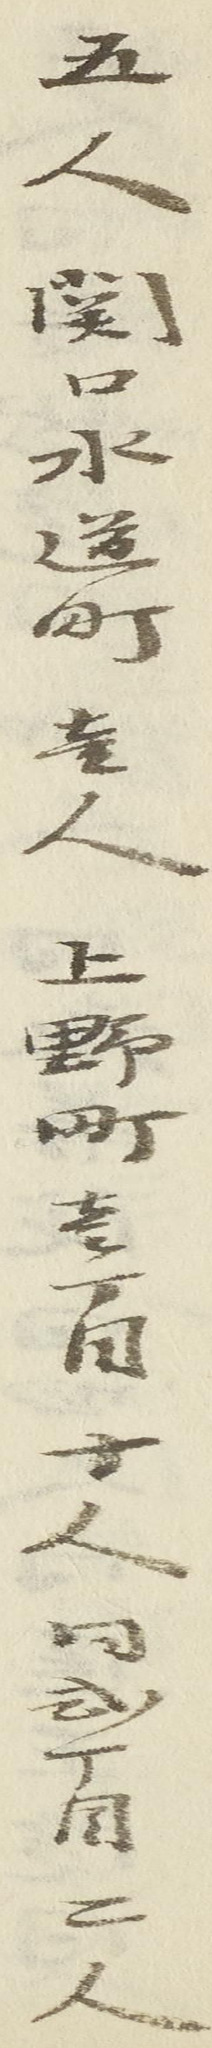五人関口水道町壱人上野町壱丁目十人同弐丁目二人
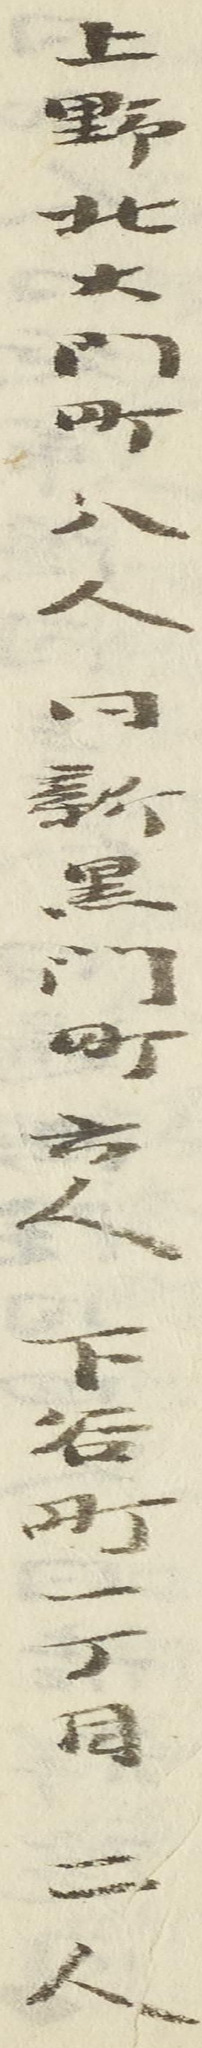上野北大門町八人同新黒門町六人下谷町一丁目二人
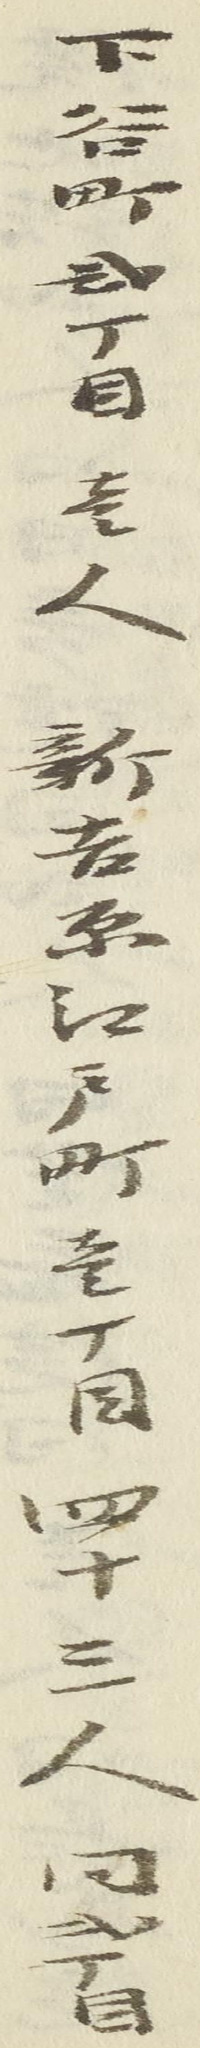下谷町弐丁目壱人新吉原江戸町壱丁目四十三人同弐丁目
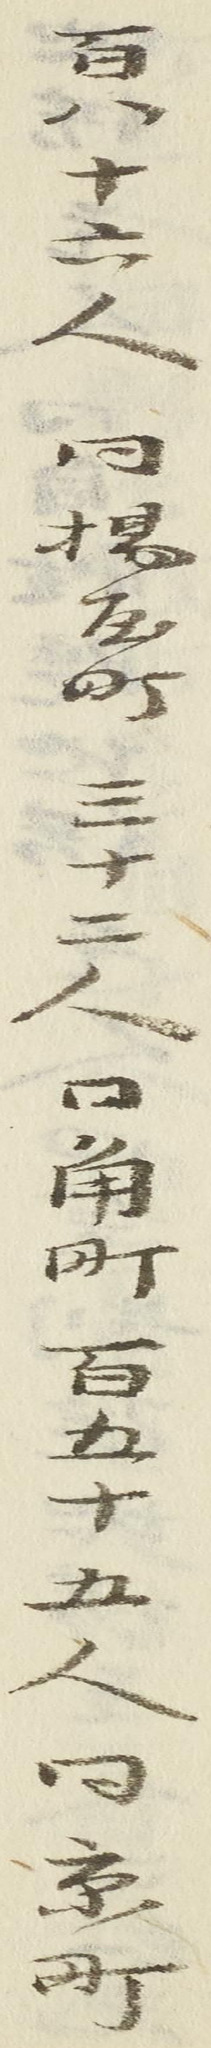百八十六人同揚瓦町三十二人同角町百五十五人同京町
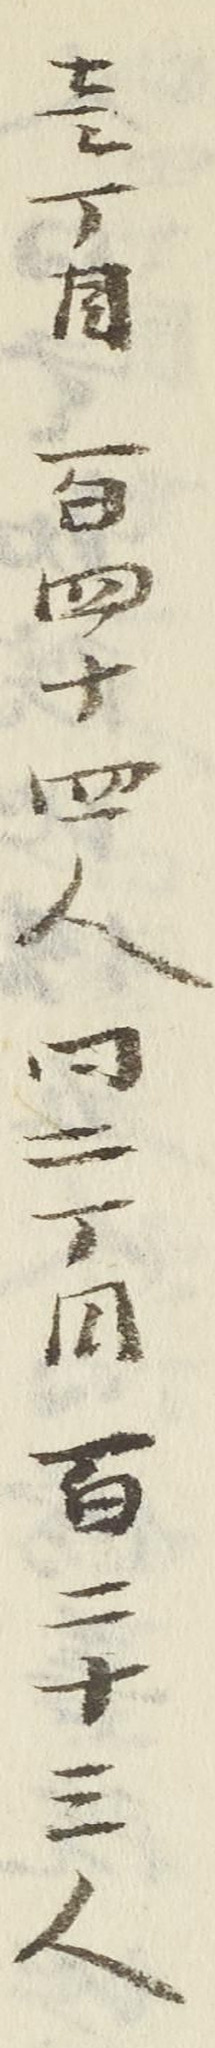壱丁目百四十四人同二丁目百二十三人
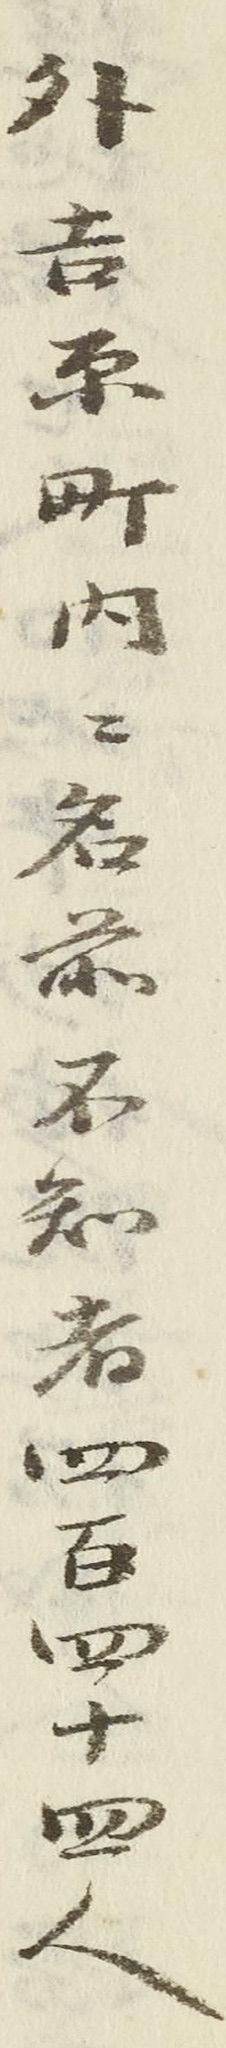外芳江あら町内二名前不知者四百四十四人
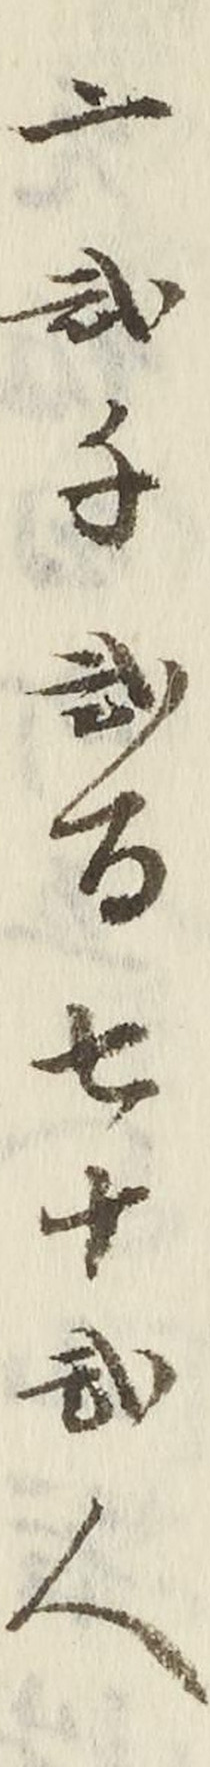〆弐千弐百七十弐人
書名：那為の後見艸　全
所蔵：東京大学地震研究所図書室 Earthquake Research Institute Library, The University of Tokyo, JAPAN
